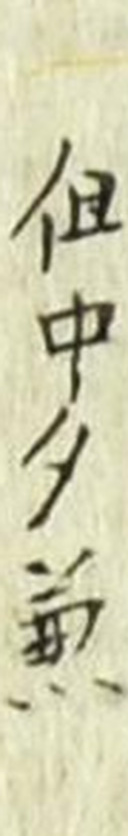但中夕兼
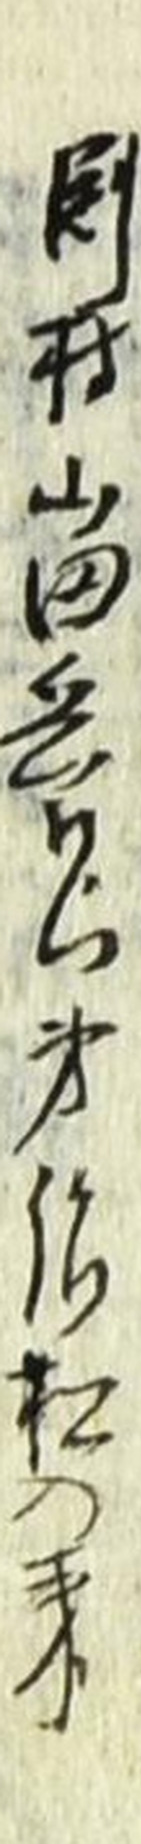淵村山田兵左衛門弟作松入来
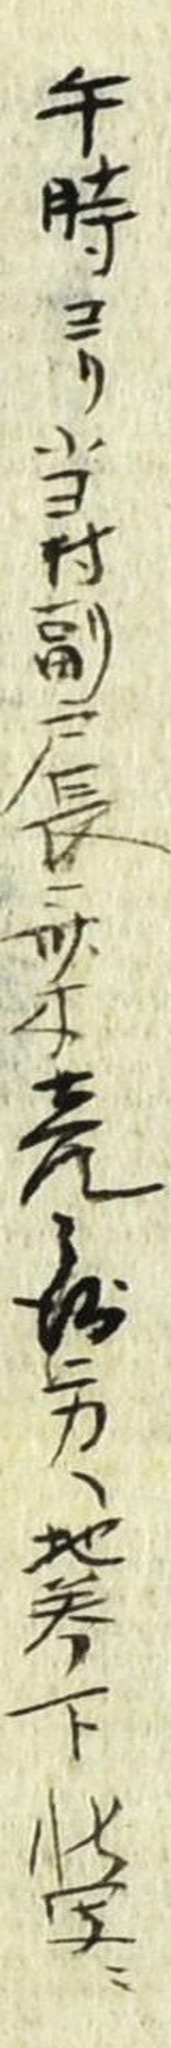午時ヨリ当村副戸長斉木彦兵衛方へ地券下帳写ニ
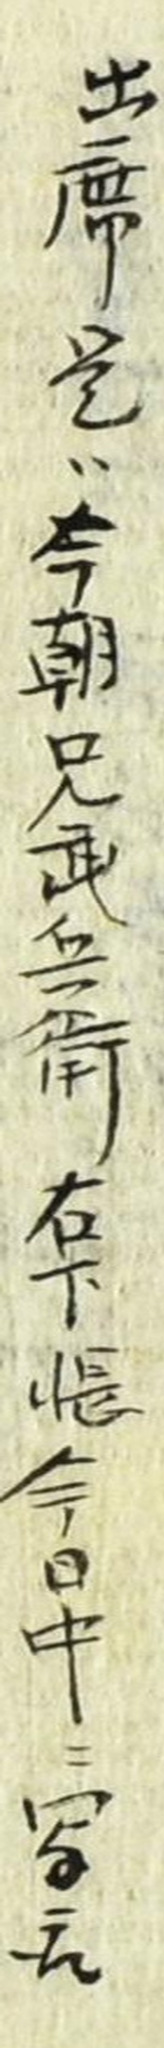出席是ハ今朝兄武兵衛右下帳今日中ニ写取
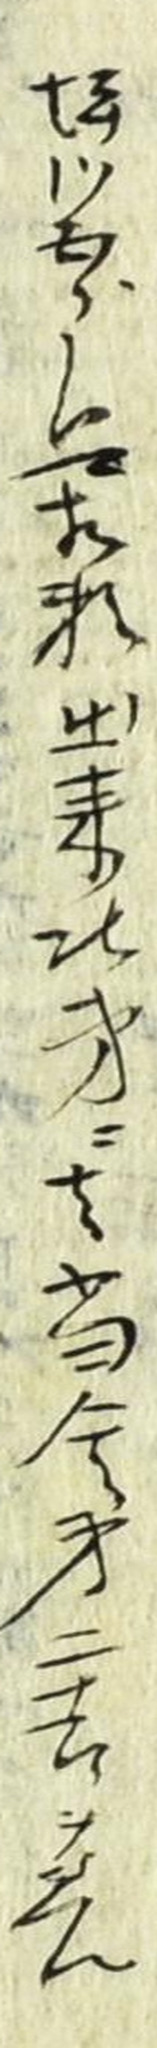坪川五郎右衛門可相頼出来次第ニ者当舎弟二吉を差
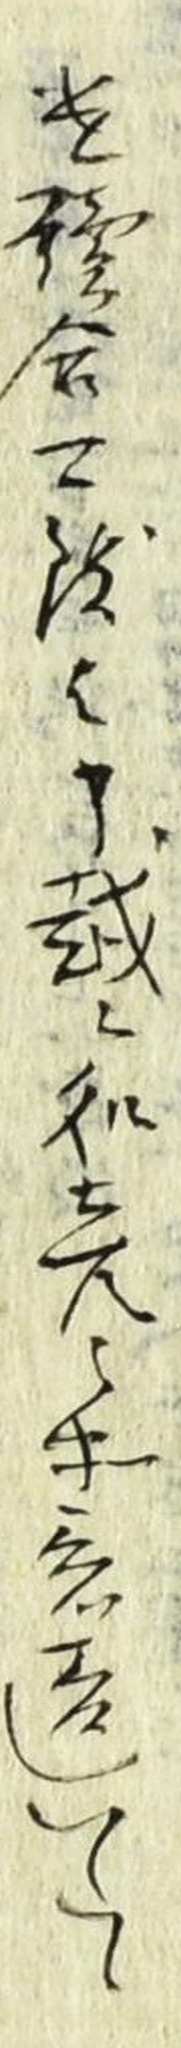遣読合可致与申越候処彦兵衛意違いたし
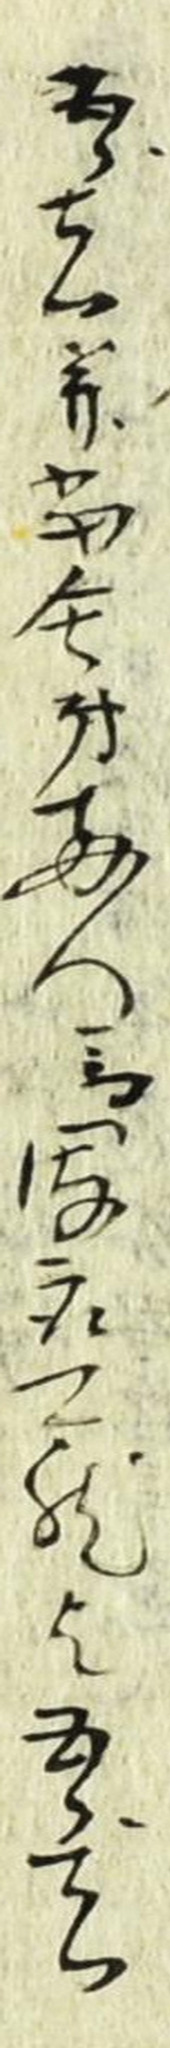五郎右衛門幷当舎弟両人ニ而写取可然与五郎右衛門
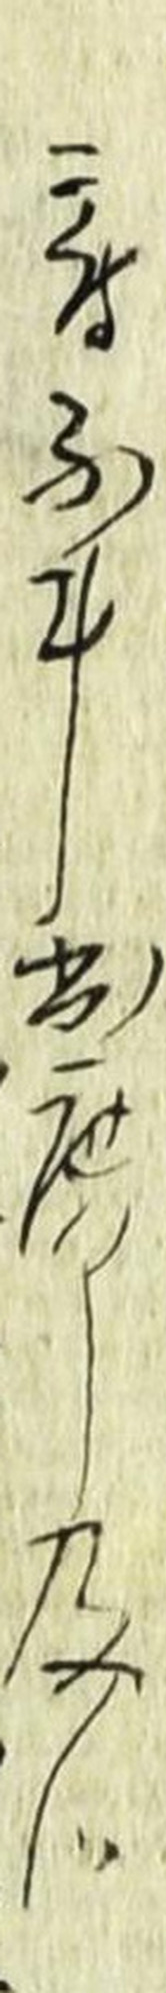ニ付不計出席及候
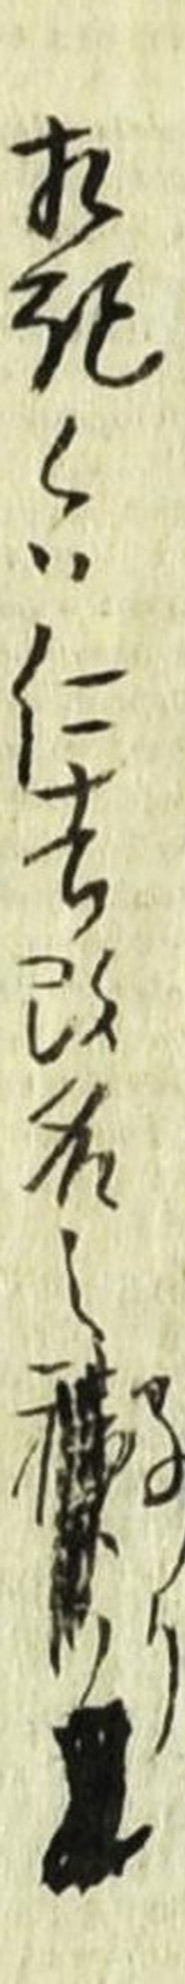相記候ハ仁吉改名之事也
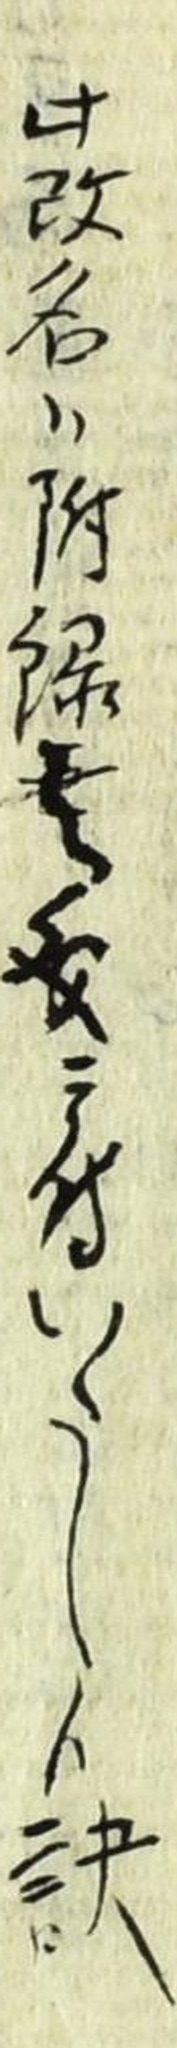此改名ハ附録之義ニ付いたし候訳
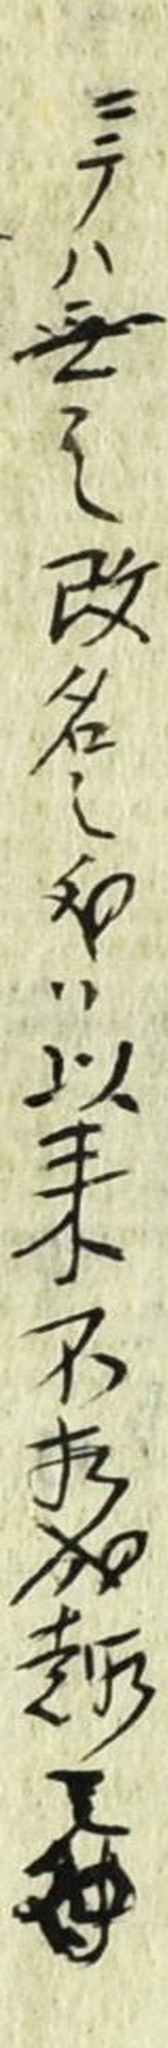ニテハ無之改名之義ハ以来不相成趣之処
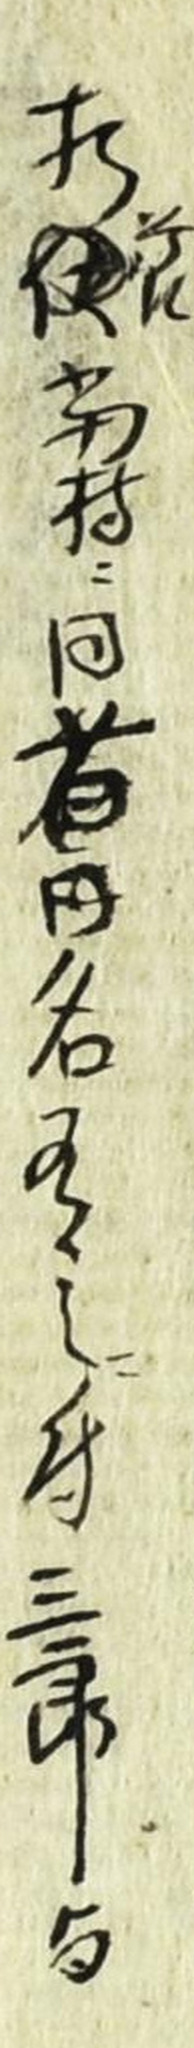折節当村ニ同苗同名有之ニ付三郎与
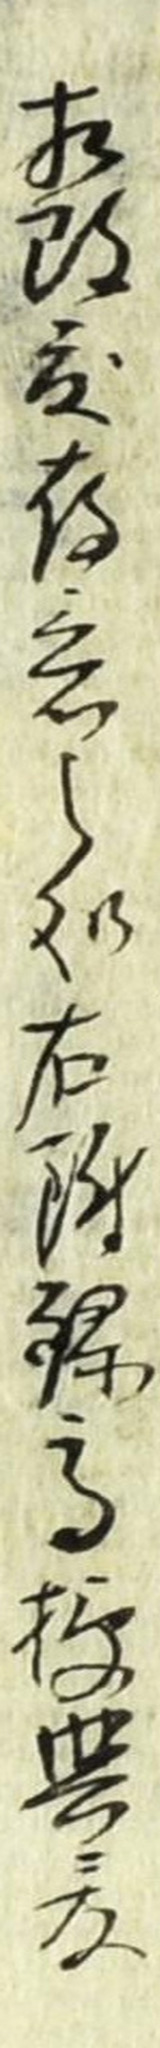相改度存意之処右附録高授与ニ及
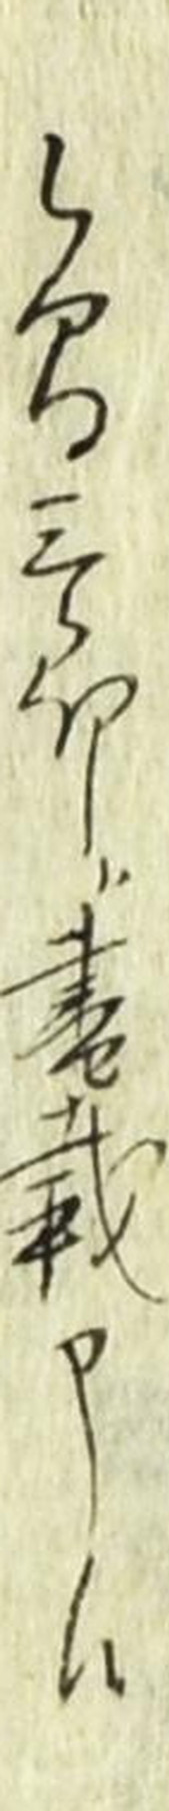候間三郎ト書載申候
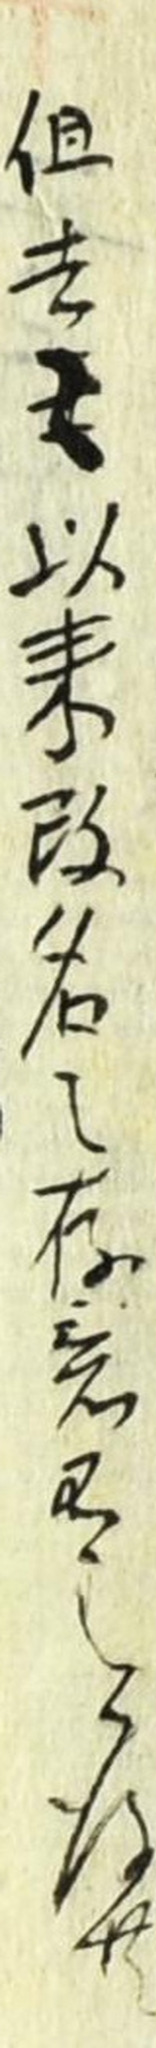但去々以来改名之存意有之候得共
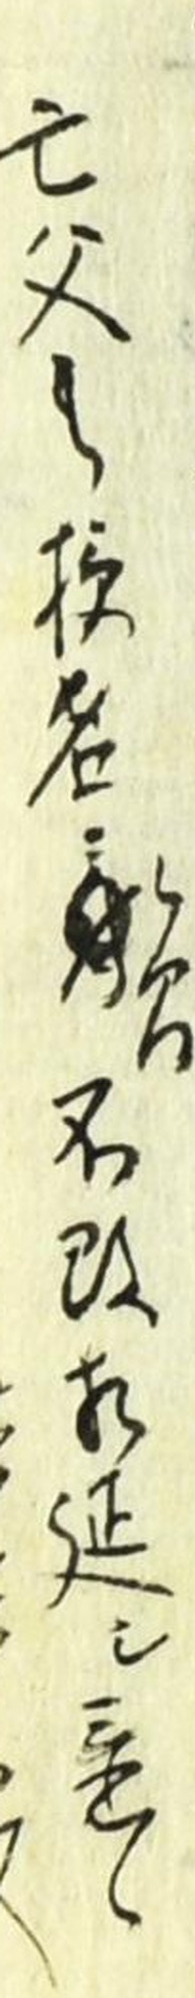亡父之授名ニ候間不改相延シ置候
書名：（日記）
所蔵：福井県文書館 Fukui Prefectural Archives
